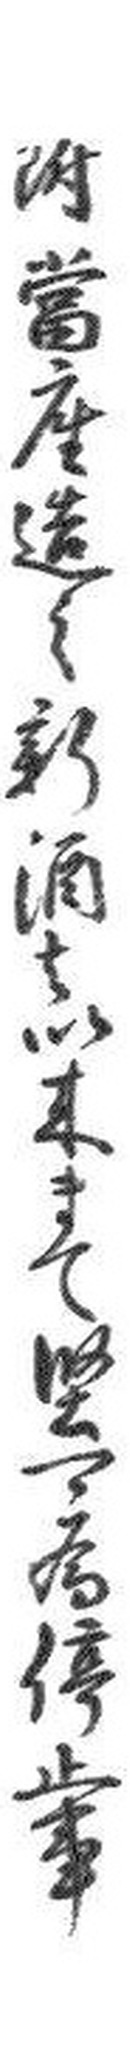附当座造之新酒者以来まて堅可為停止事
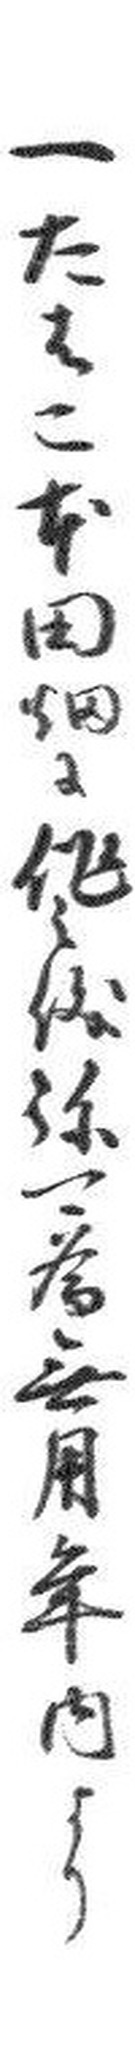一たはこ本田畑に作之儀弥可為無用年内より
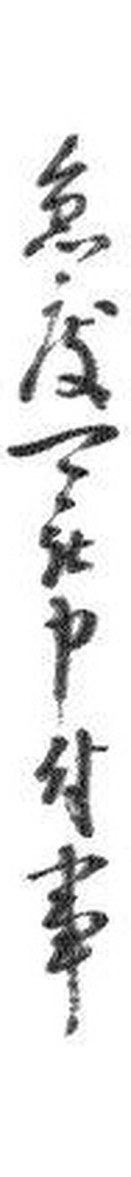急度可被申付事
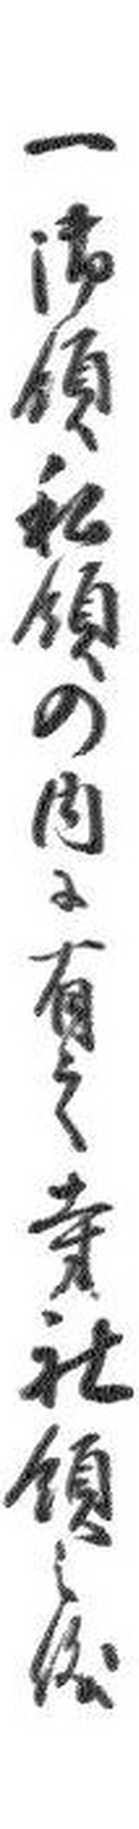一御領私領の内に有之寺社領之儀
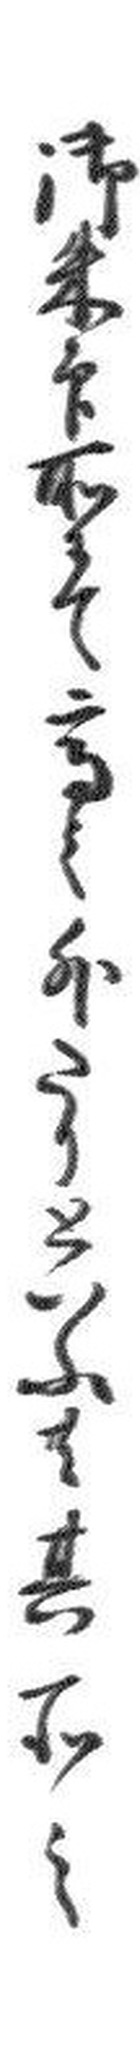御朱印所にて高之外たりといふ共其所之
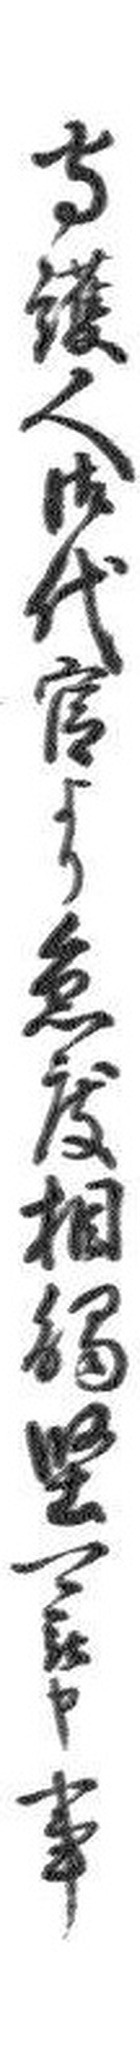守護人御代官より急度相触堅可被申事
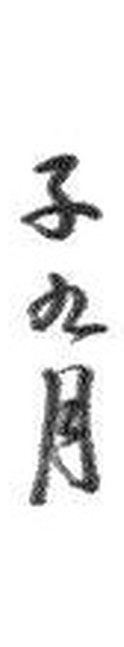子九月
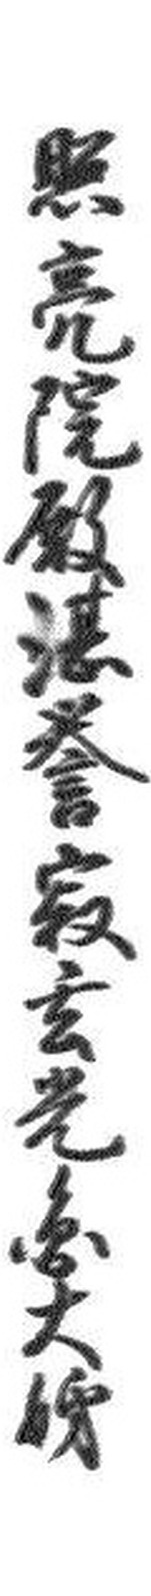照亮院殿湛誉寂玄光円大姉
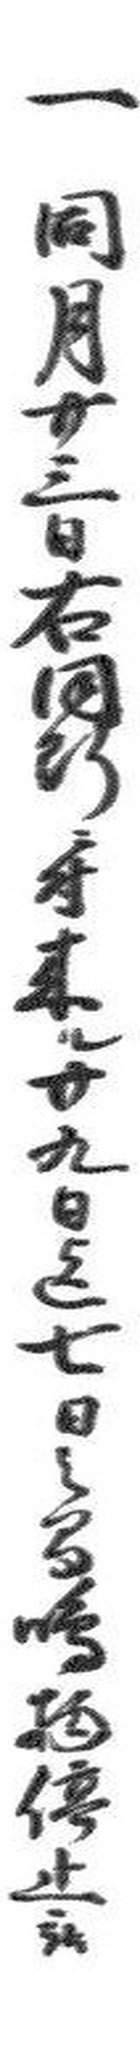一同月廿三日右同断ニ付来ル廿九日迄七日之間鳴物停止被

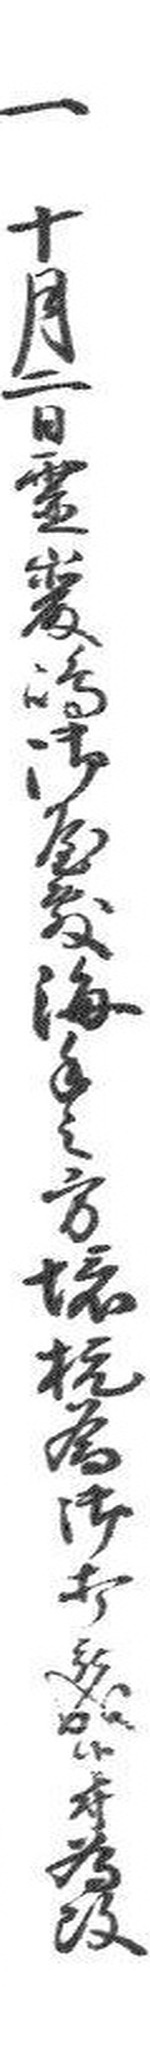一十月二日霊巌島御屋敷海手之方境杭為御打被成候ニ付為改
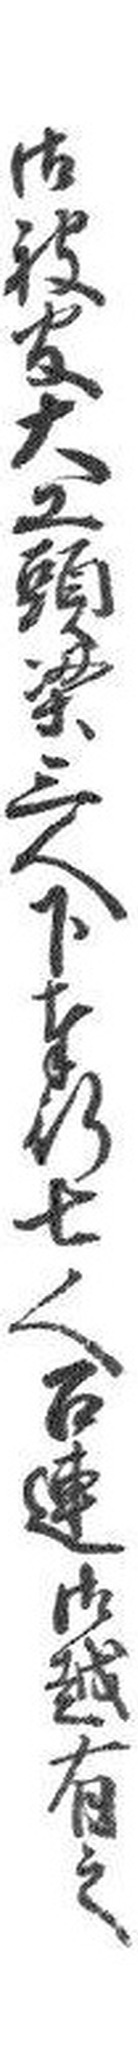御被官大工頭梁三人下奉行七人召連御越有之
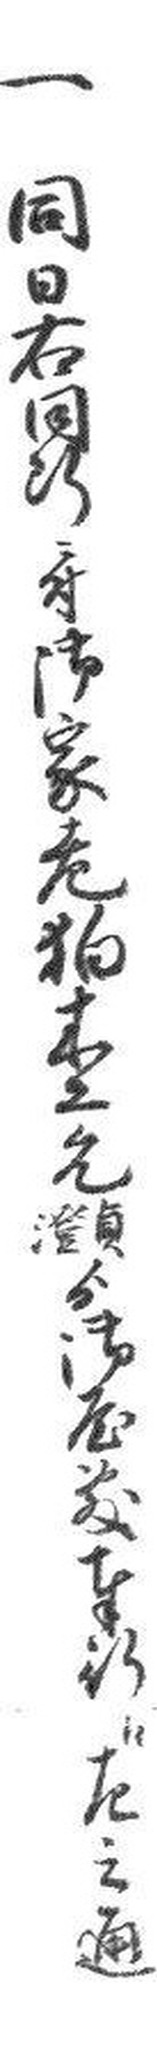一同日右同断ニ付御家老狛杢允貞澄ゟ御屋敷奉行江左之通
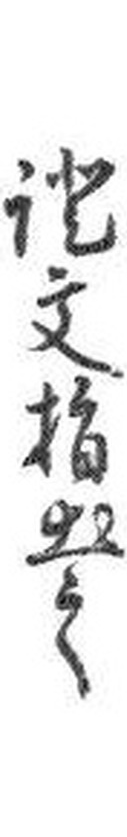證文指出之
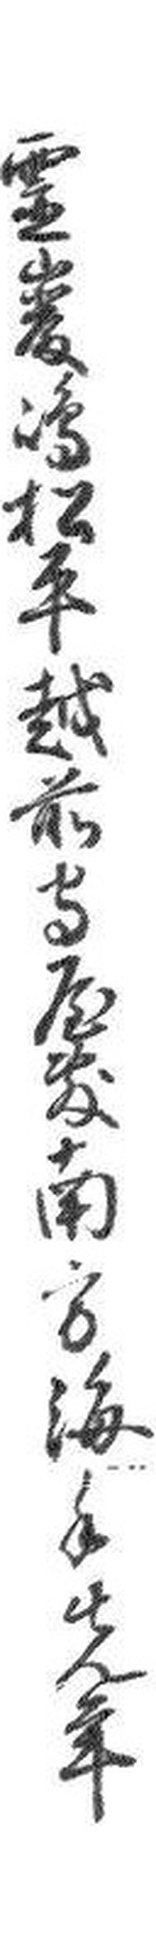霊巌島松平越前守屋敷南方海手先年
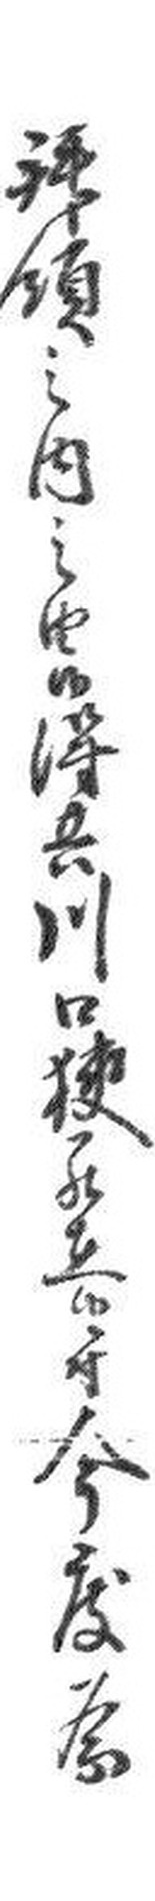拝領之内之由候得共川口狭罷在候ニ付今度為
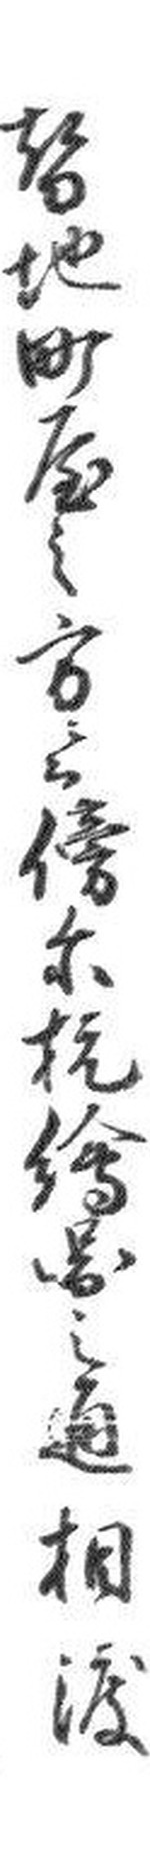替地町屋之方ニ而傍尓杭絵図之通相渡
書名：家譜 八 光通公 従寛文十年到同十二年
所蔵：福井県文書館 Fukui Prefectural Archives
